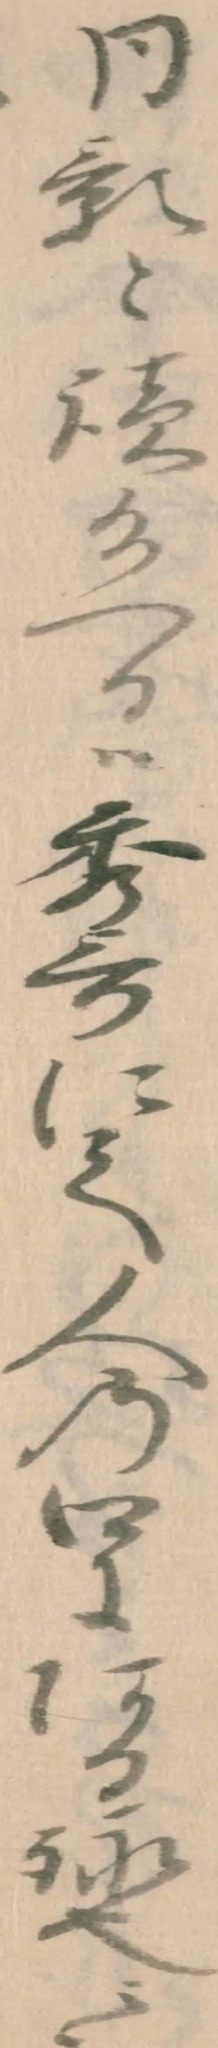月影と読給へるは秀哥にて人の口にある詠也云々
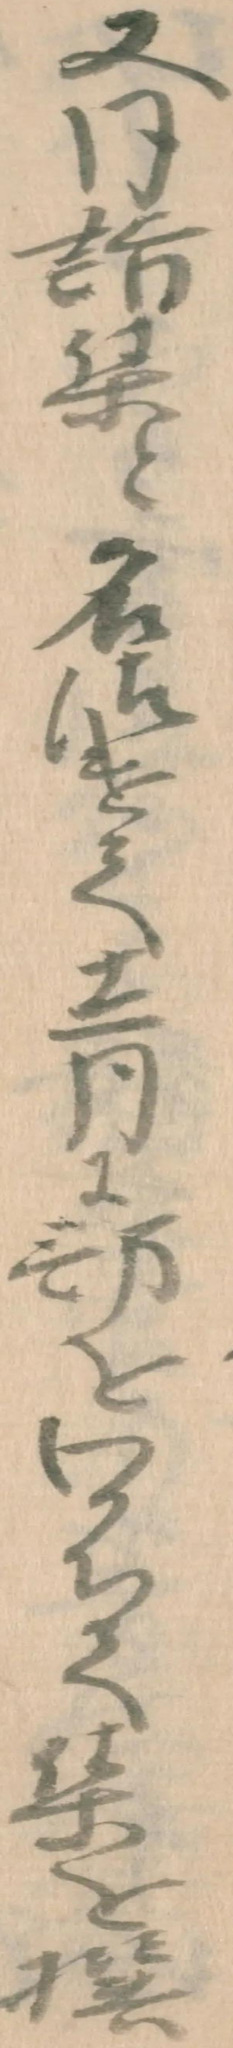又月詣集と名つけて十二月に部をわかちて集を撰
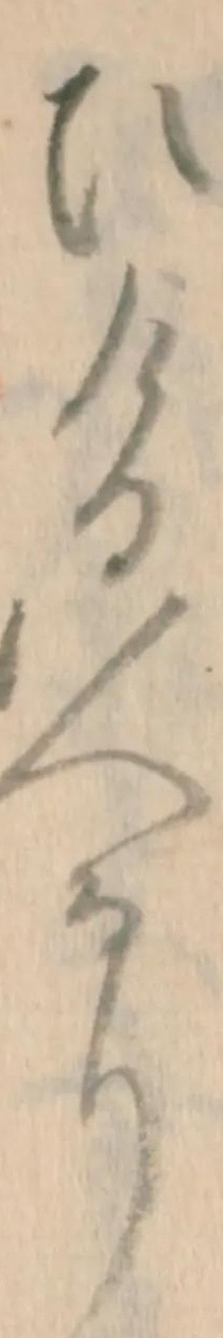ひける人なり
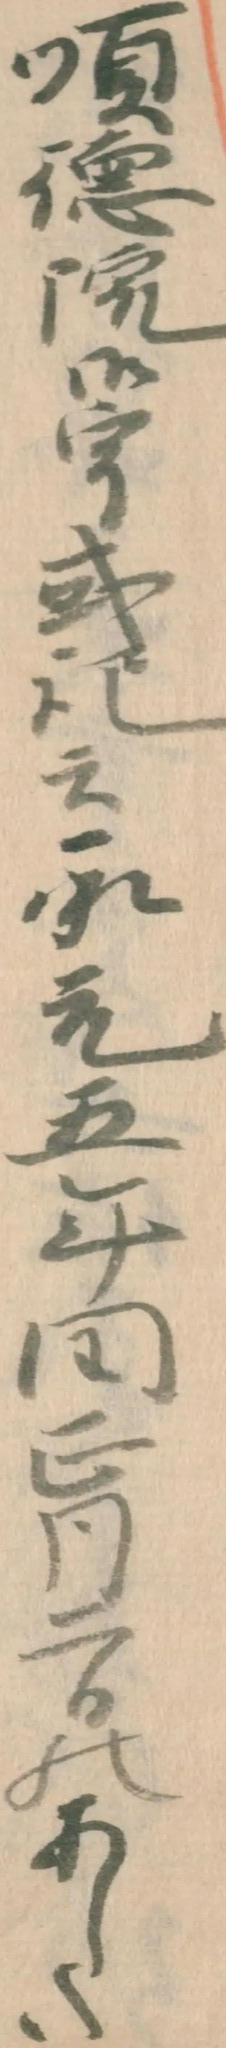順徳院御宇或記云承元五年閏正月二日のあした
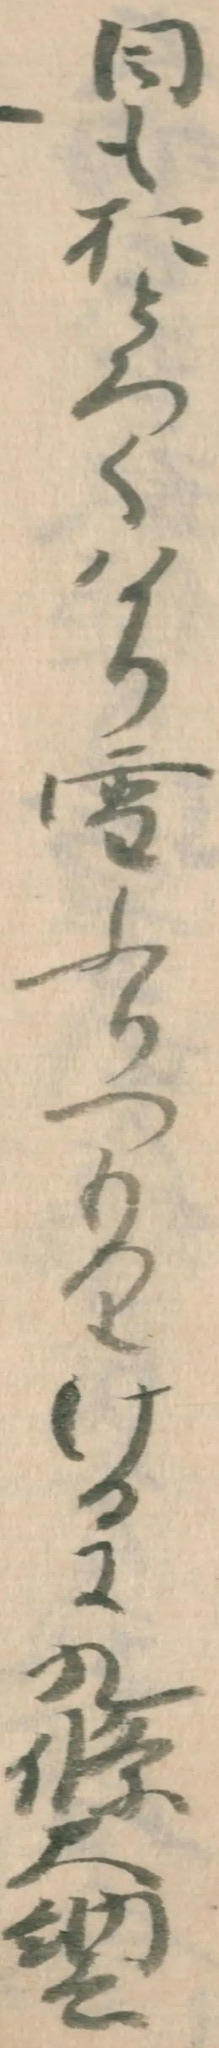目もおとろくはかり雪ふりつもりけるに九条大納言
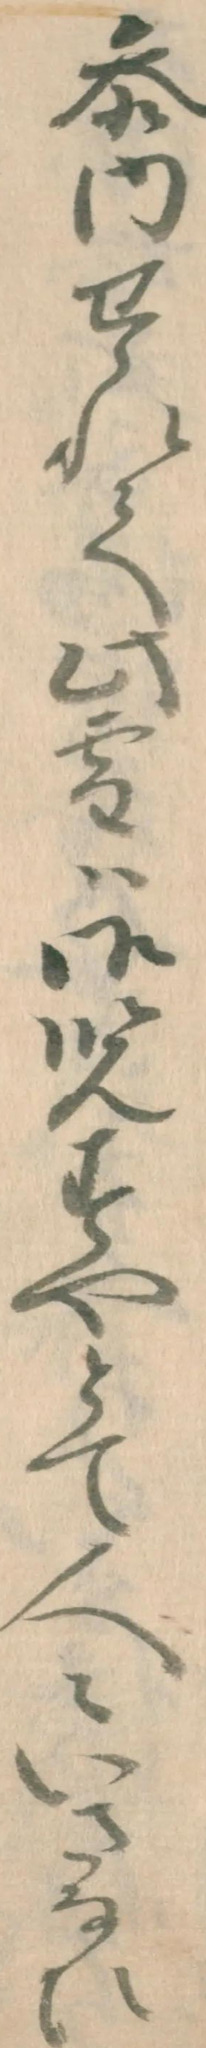参内せられて此雪は御覧すやとて人々いさなひ
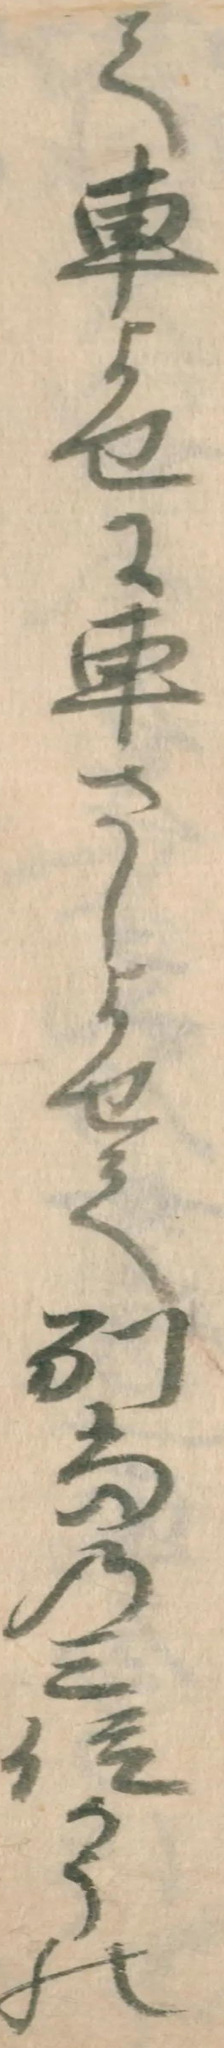て車よせに車さしよせて別当の三位かうの
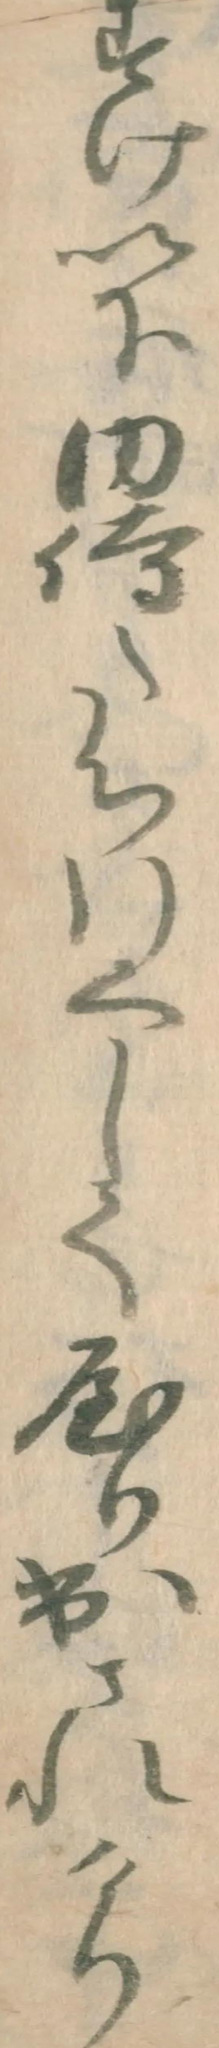すけ以下内侍たち引くしてやり出されけり

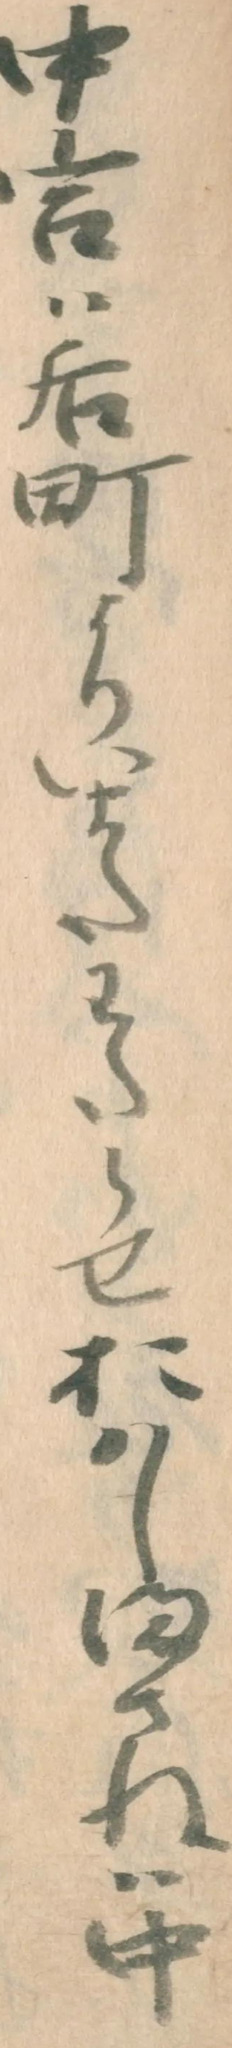中宮は后町よりいまたわたらせおはしまさねは中
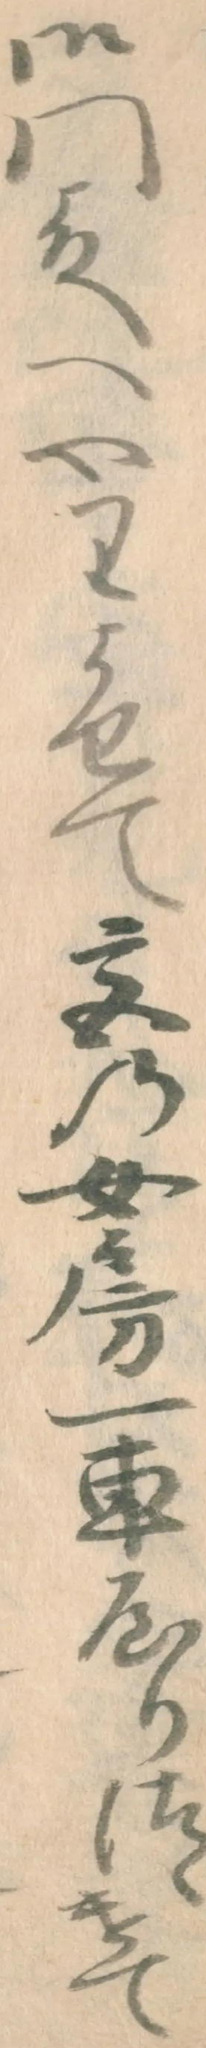御門殿へやりよせて宮の女房一車やりつゝけて
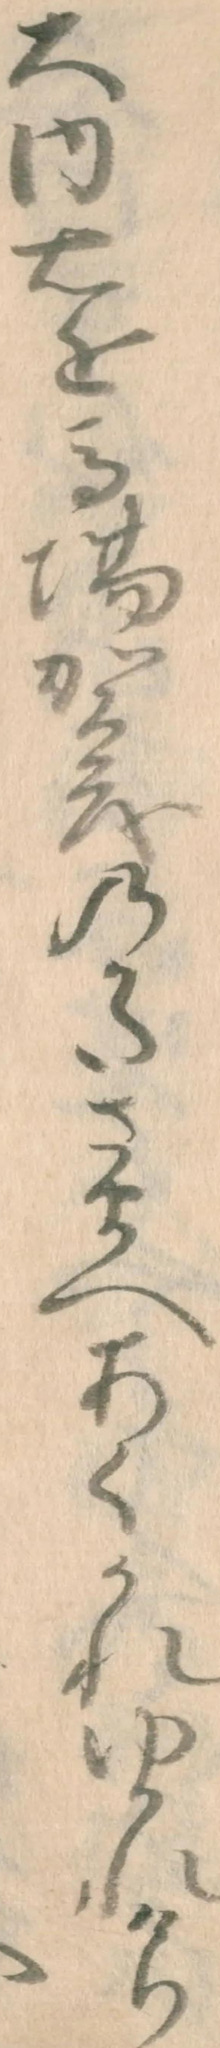大内右近馬場賀茂のかたさまへあくかれゆかれけり
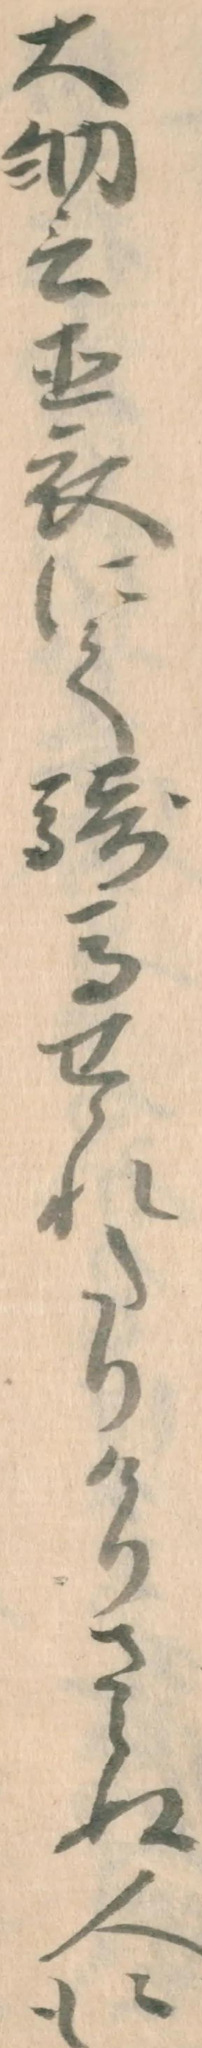大納言直衣にて騎馬せられたりけりさらぬ人々も
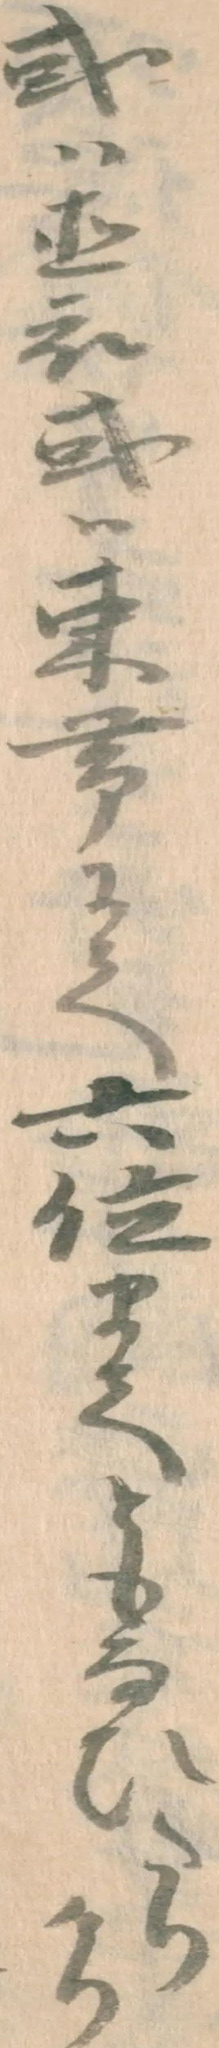或は直衣或は束帯にて六位まてともなひたりけり
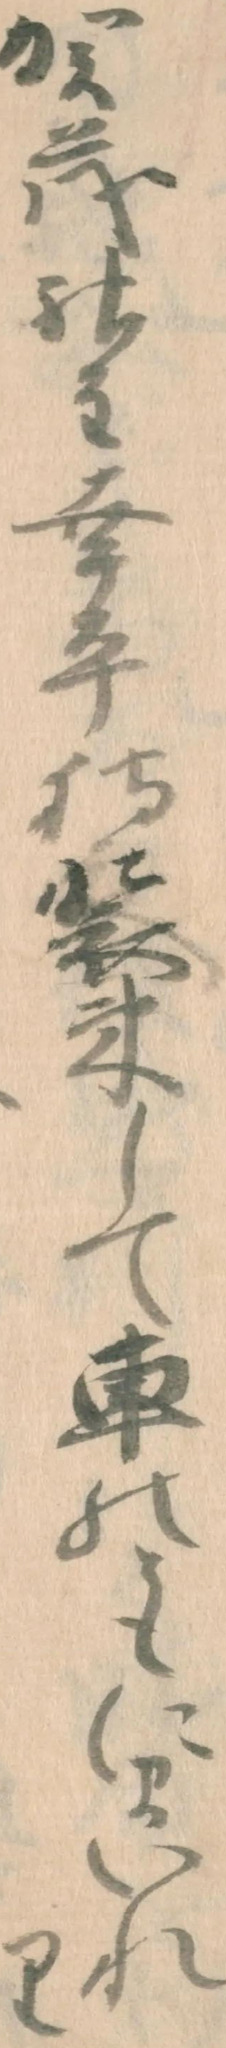賀茂神主幸平狩装束して車のともにまいれり
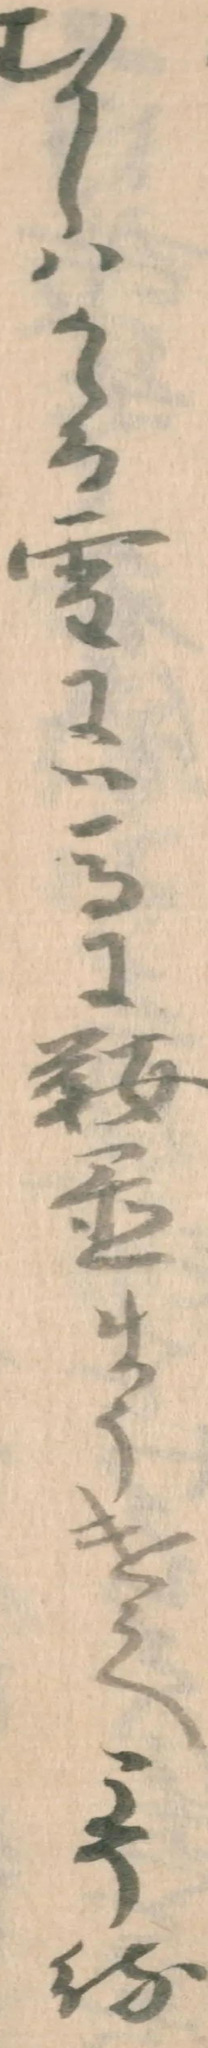むかしはかゝる雪には馬に鞍置まうけてこそ侍
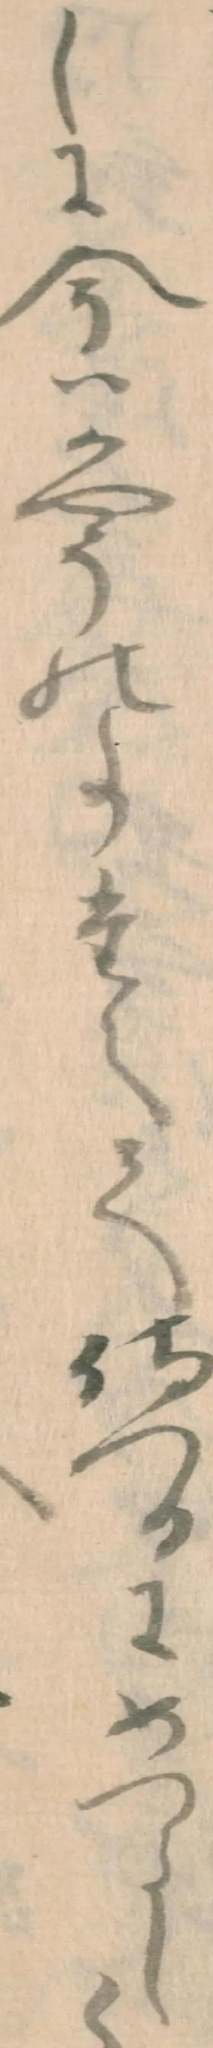しに今はかやうの事たえて侍つるにめつらしく
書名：賀茂社記録. 第1冊
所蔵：国立国会図書館 National Diet Library, JAPAN
